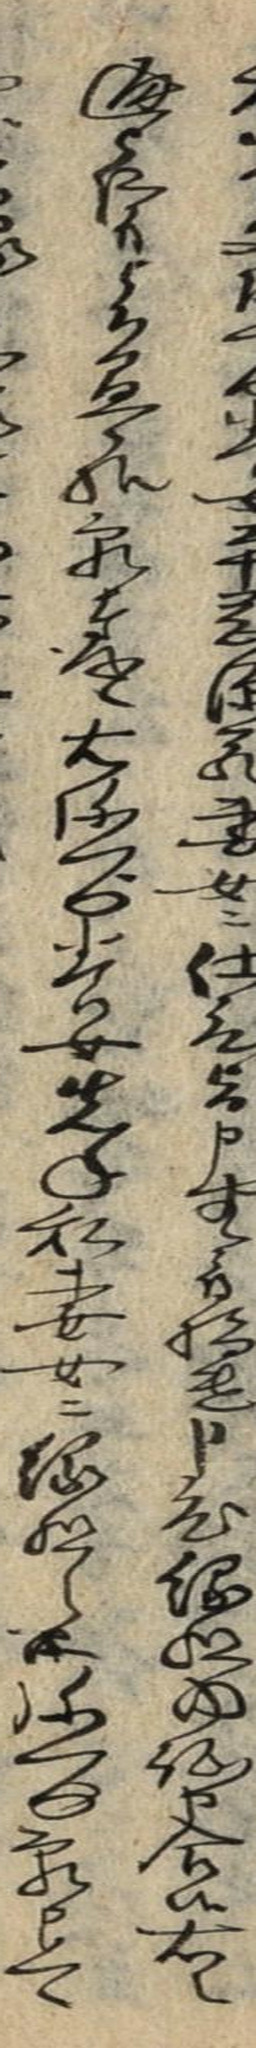通被仰付被下置候様願奉存候右弥一右衛門養女先年私妻女ニ縁組候儀弥一右衛門願申上候
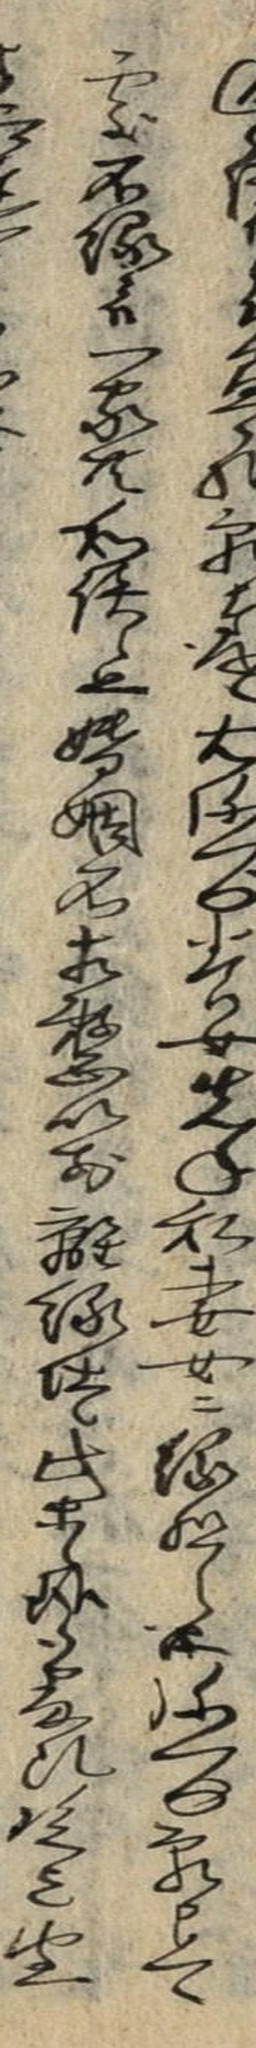処不縁ニ付一家共和談之上婚姻不相整以前離縁仕候此等之趣御番頭殿迄宜
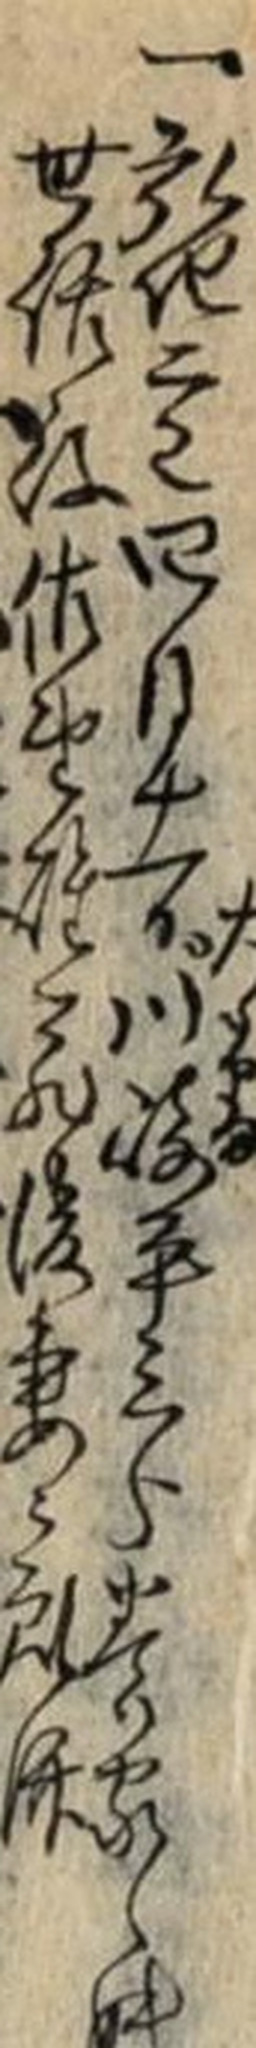世話役佐野雄蔵後妻ニ願済
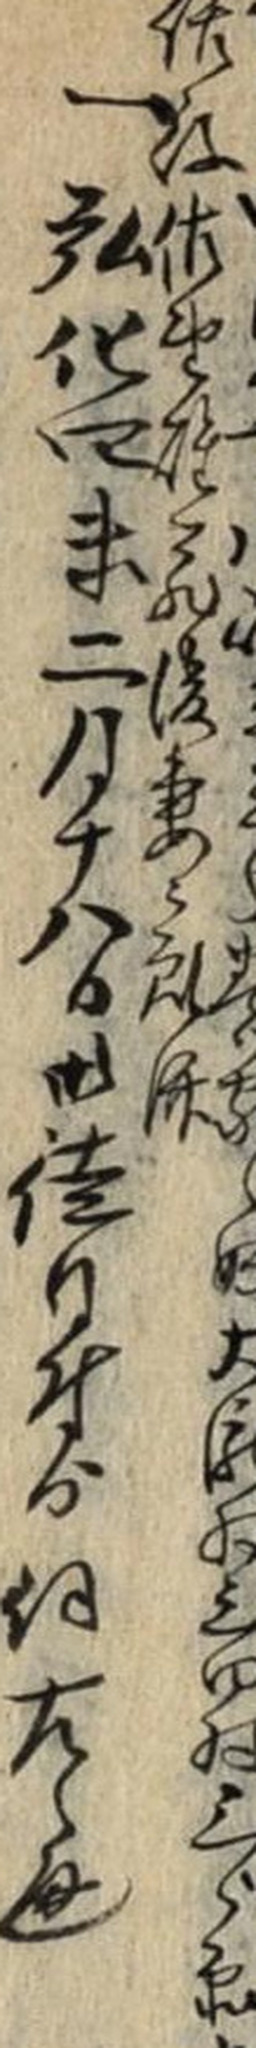一弘化四未二月十八日御徒目付ゟ伺左之通
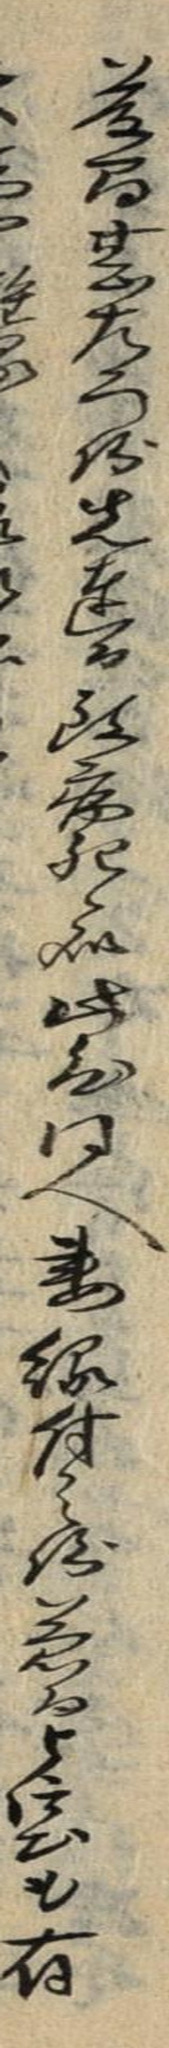藤間甚左衛門儀先達而致病死候処此度同人妻縁付候儀兼而被仰出も有
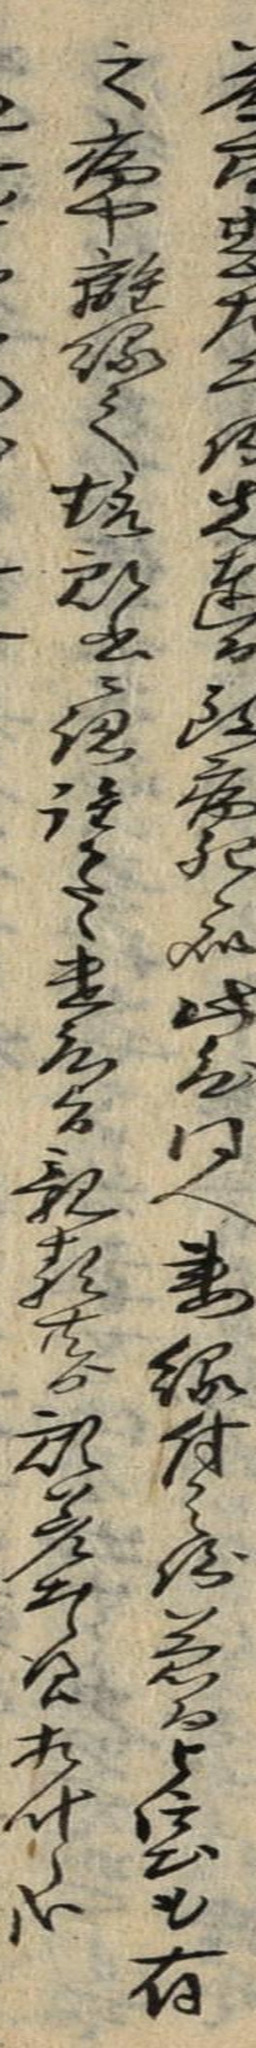之病中離縁之趣願書ニ認誰かたへ遣度旨親類共ゟ願差出候得ハ相叶候哉
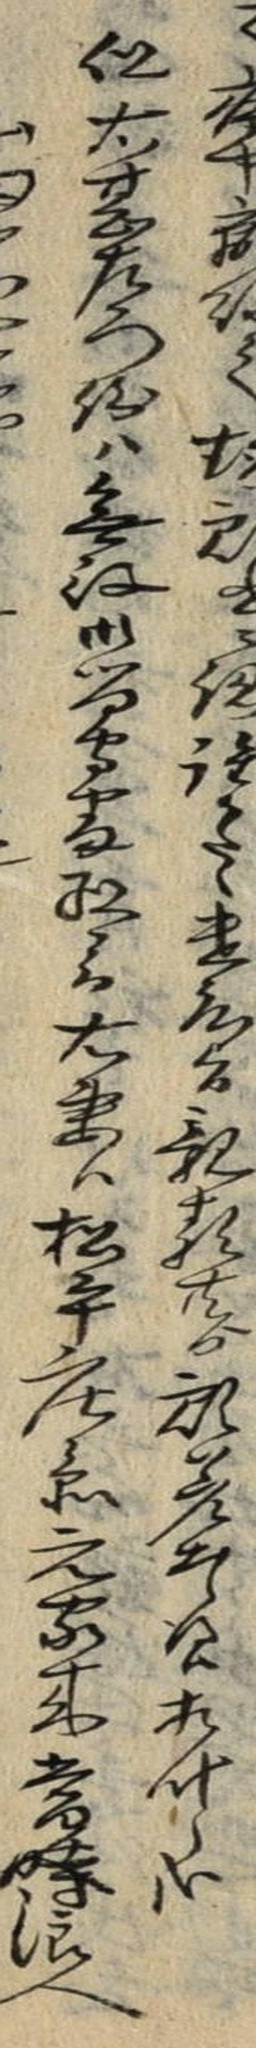但右甚左衛門儀ハ無役御留守番組ニ而右妻ハ松平庄兵衛元家来当時浪人
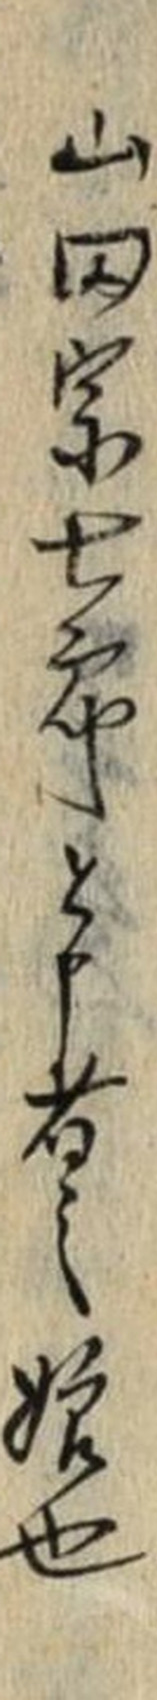山田宗七郎と申者之娘也
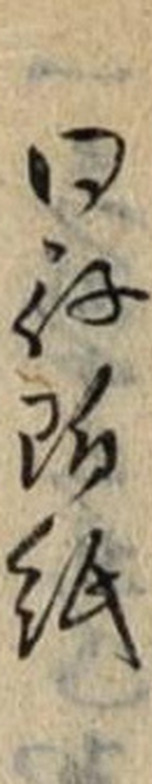同役附紙
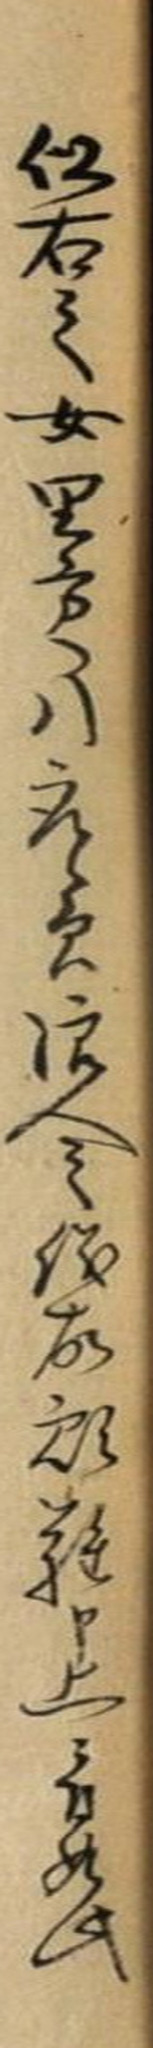但右之女里方へ引取候而ハ浪人之儀故願難申上ニ付如此
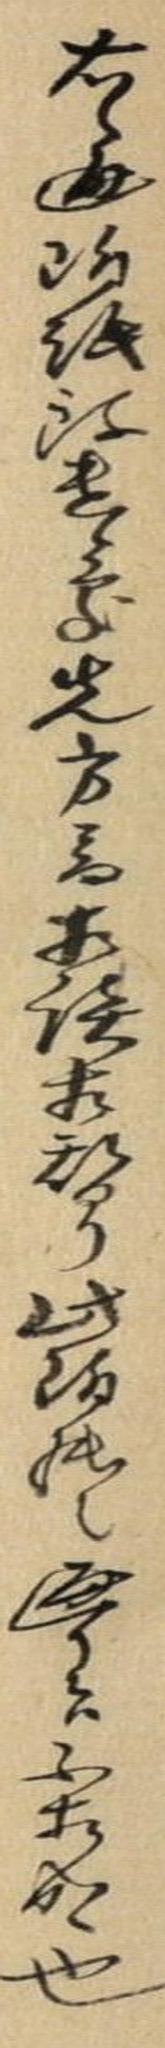右之通附紙致遣候処先方ニ而相談相替り此附紙之通りニハ不相成候也
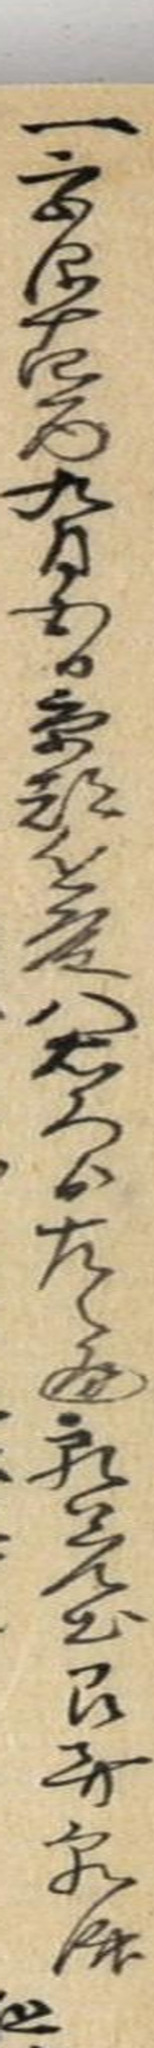一享保十四酉九月五日京都近藤八右衛門ゟ左之通願差出即刻願済
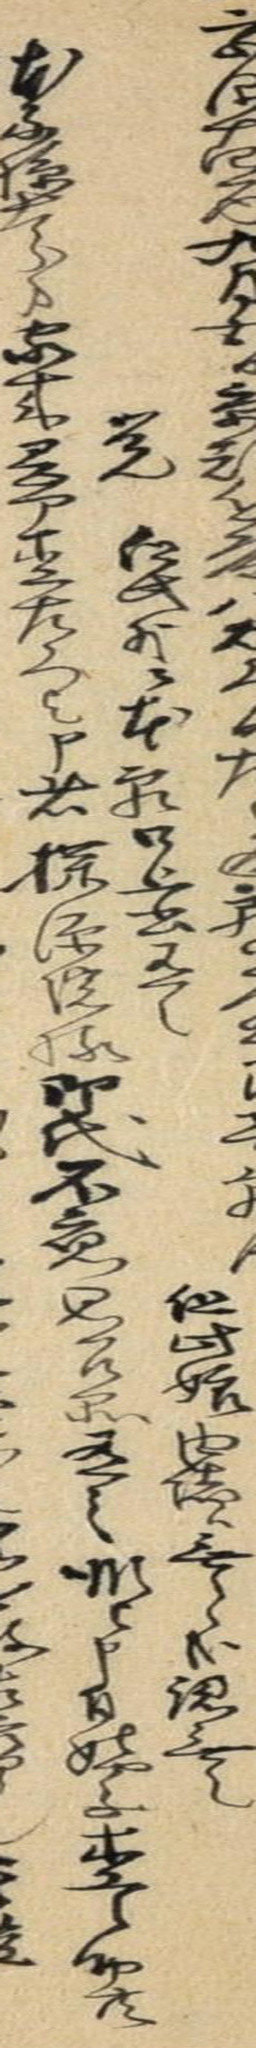本多孫太郎方家来岡部杢左衛門と申者探源院様御代不応思召品有之暇被申付嫡子杢之助共
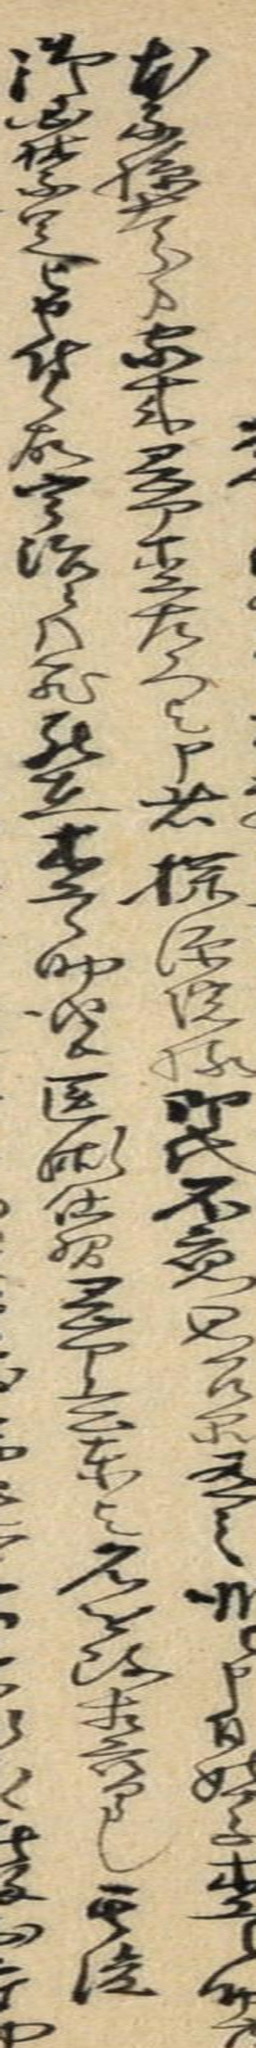御国禁足被申付候故宇治ニ引籠罷在杢之助儀ハ医術仕習岡部玄東と名を改相暮申候其後
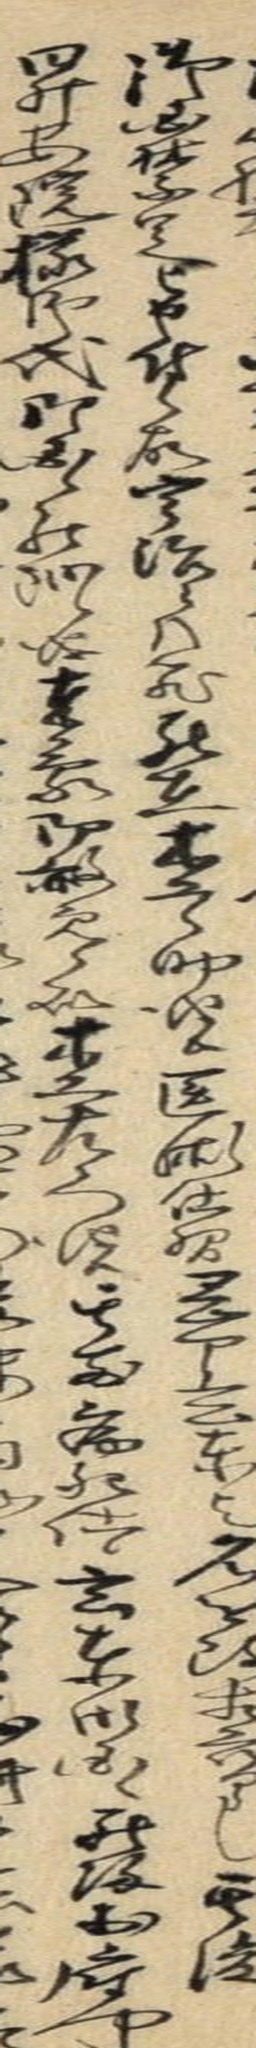昇安院様御代御国へ罷越候儀奉蒙御赦免候処杢左衛門儀ハ其前病死仕候玄東御国へ罷帰於府中
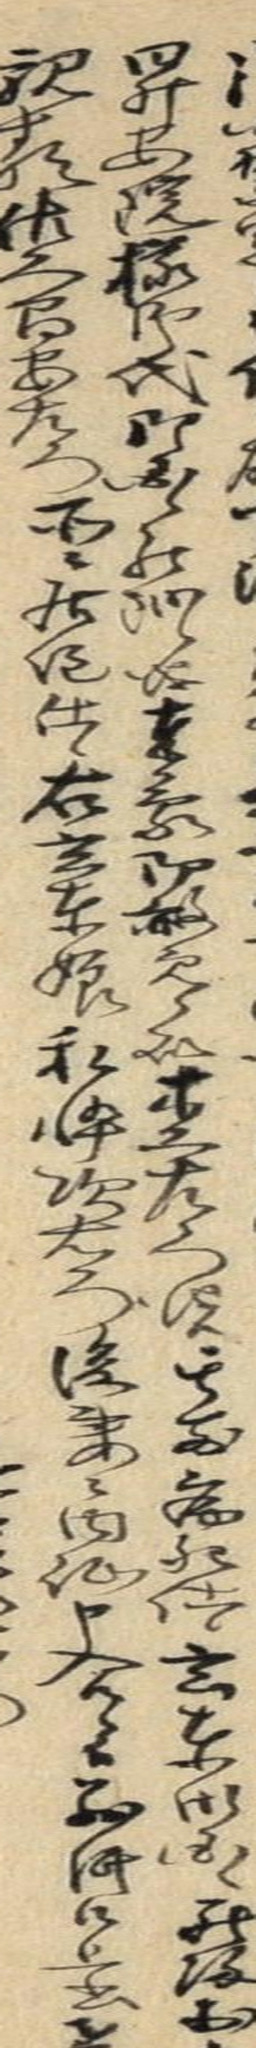親類佐久間安左衛門所に居住仕候右玄東娘私倅次右衛門後妻ニ内証申合候ニ付別紙口上書を以願
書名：養子縁組之部
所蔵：福井県文書館 Fukui Prefectural Archives
